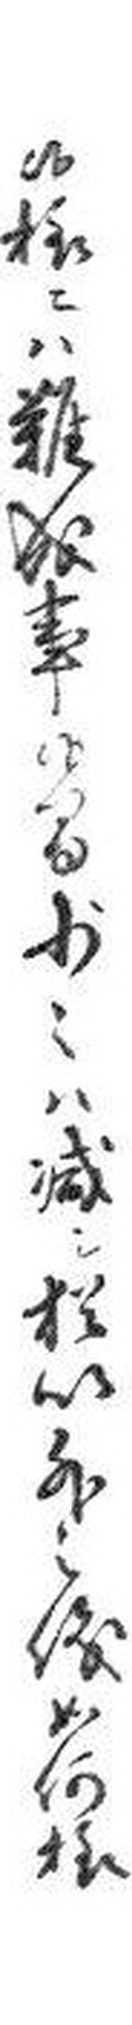候様ニハ難成事候間少々ハ減シ猶以外之儀如何様
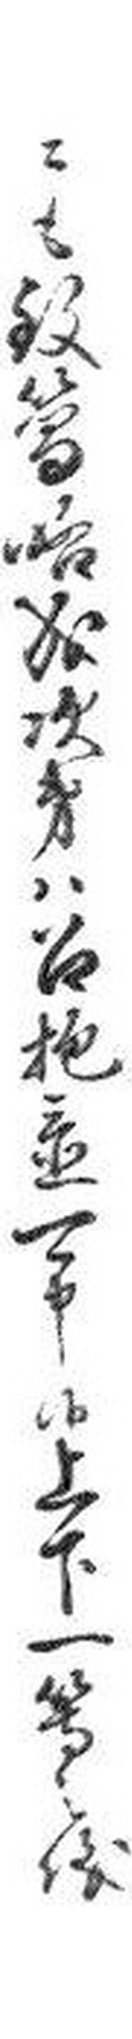ニも致簡略成次第ハ召抱置可申候上下一等之儀
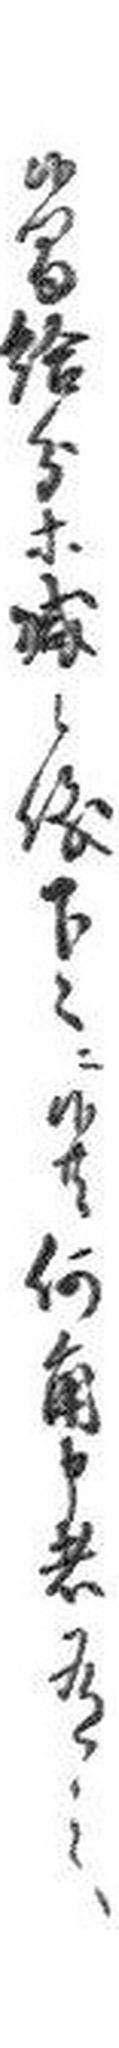候間給分等減候儀下々ニ候共何角申者有之
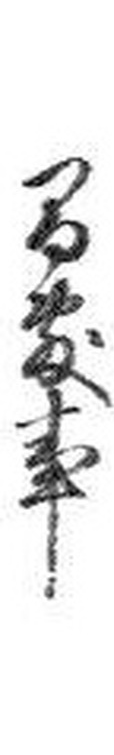間敷事
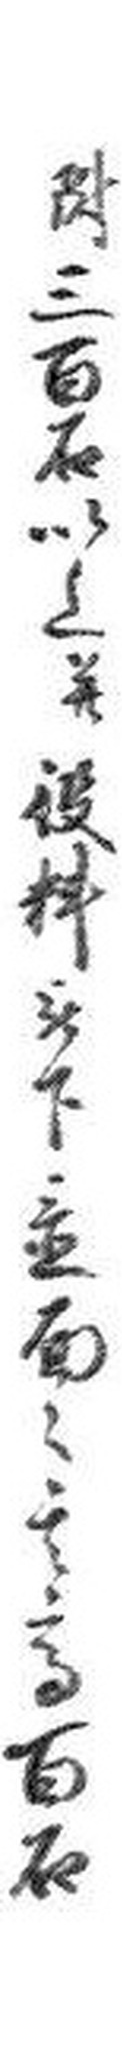附三百石以上并役料被下置面々其高百石
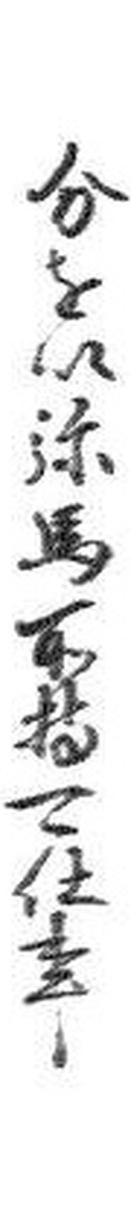分を以弥馬所持可仕事
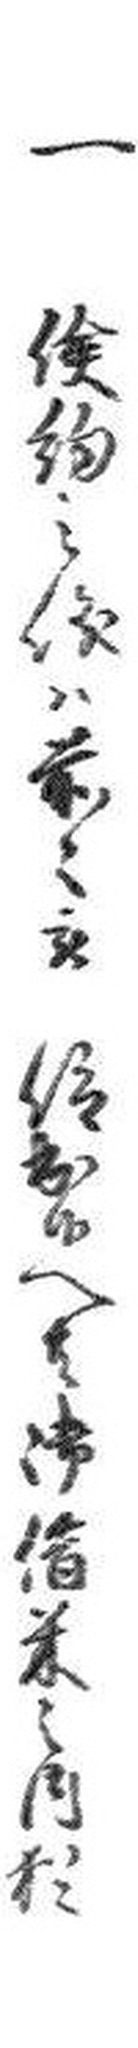一倹約之儀ハ前々被仰出候へ共御借米之内於
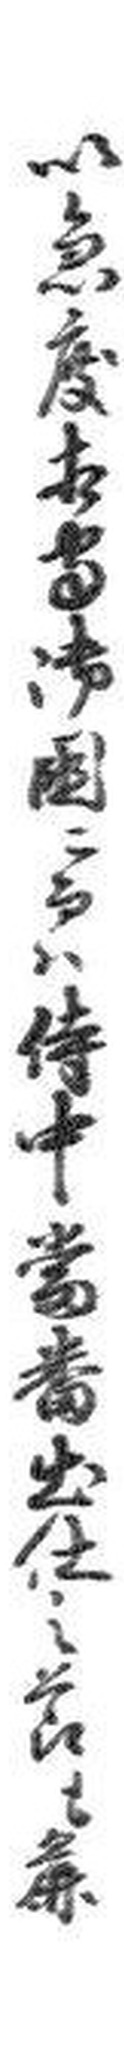以急度相守御国ニ而ハ侍中当番出仕之節も麁
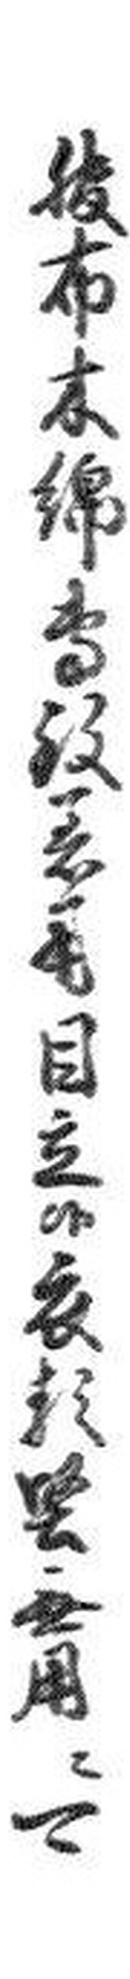服布木綿専致着用目立候衣類堅無用ニ可
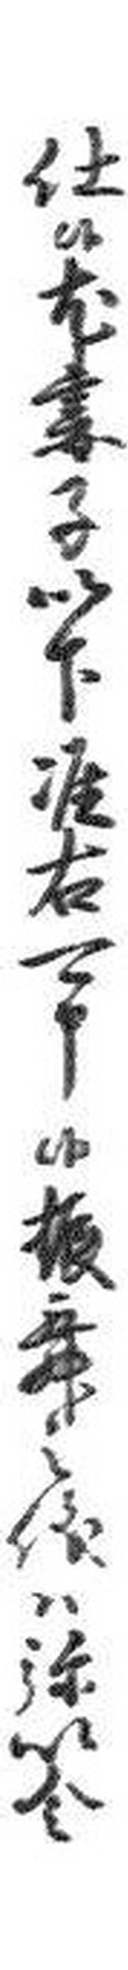仕候尤妻子以下准右可申候振舞之儀ハ弥以全
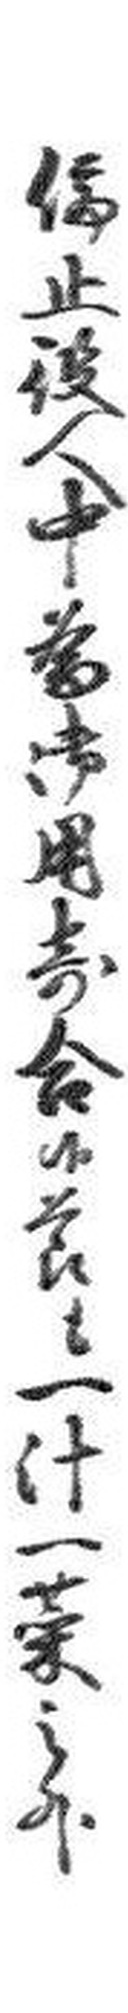停止役人中為御用寄合候節も一汁一菜之外
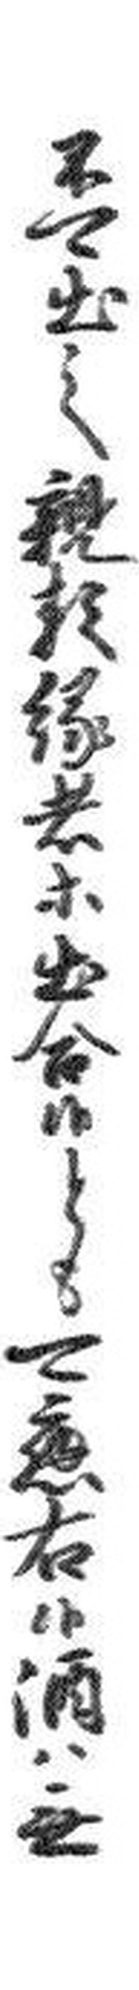不可出之親類縁者等出合候とも可応右候酒ハ無

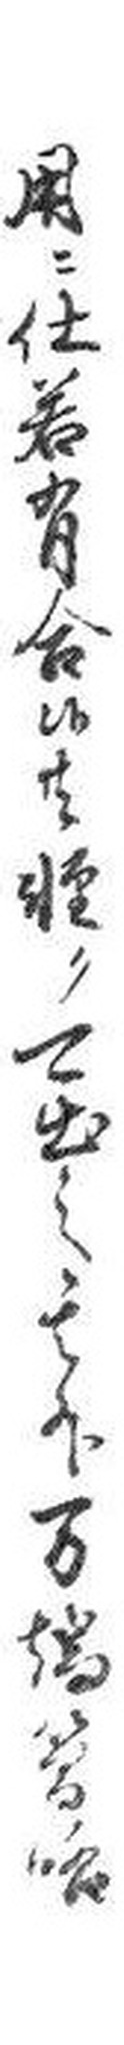用ニ仕若有合候共軽ク可出之其外万端簡略
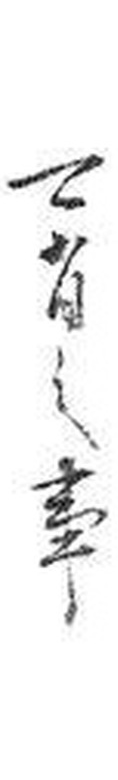可有之事
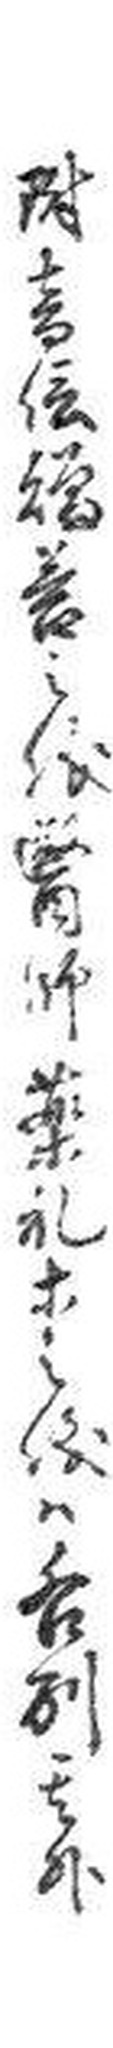附音信贈答之儀医師薬礼等之儀ハ各別其外
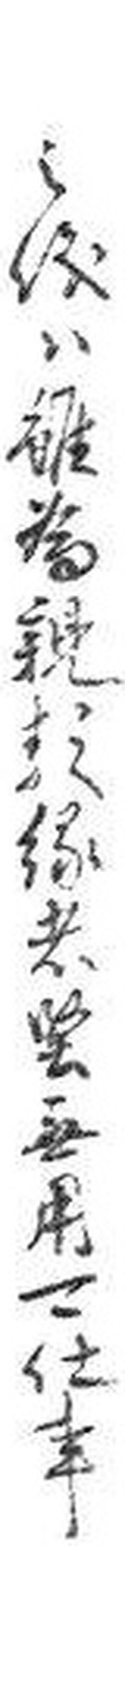之儀ハ雖為親類縁者堅無用可仕事
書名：家譜 二十三 吉品公 従宝永元年到同二年
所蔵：福井県文書館 Fukui Prefectural Archives
